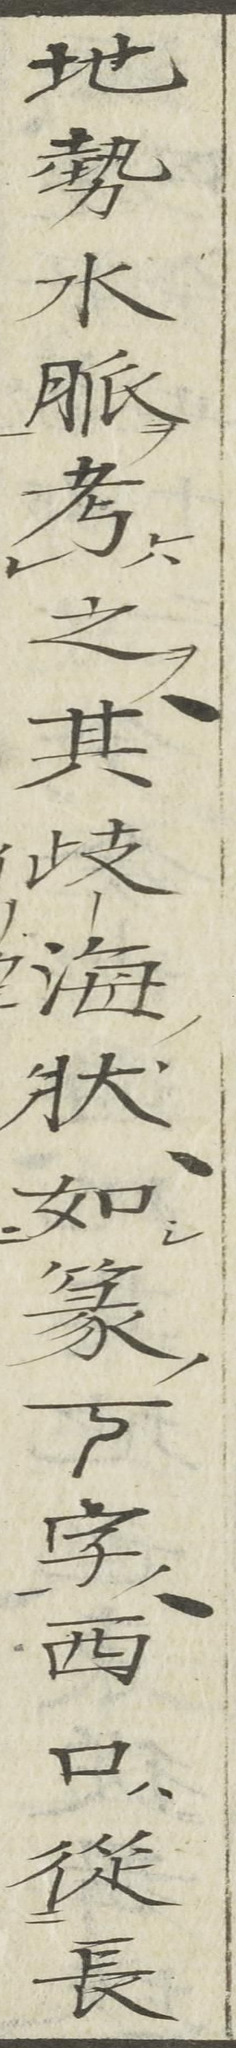地勢水脈考之、其歧海状、如篆丅字、西口従長
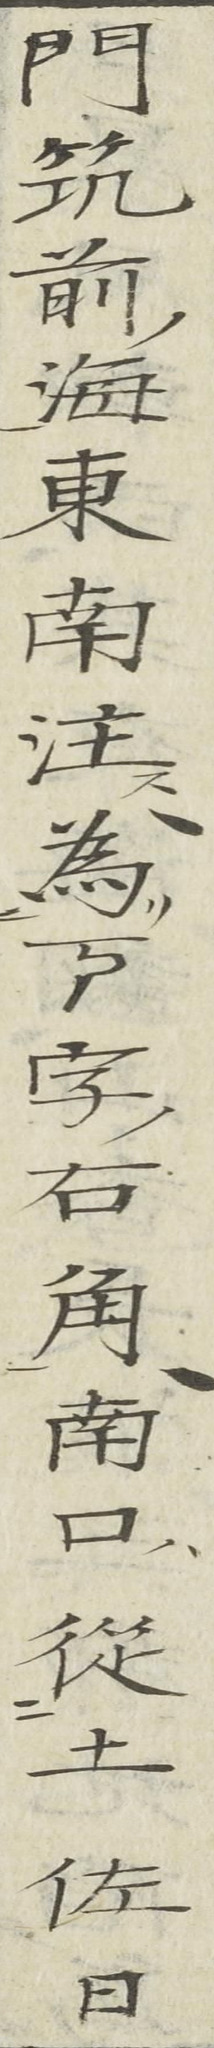門筑前海東南注、為丅字右角、南口従土佐日
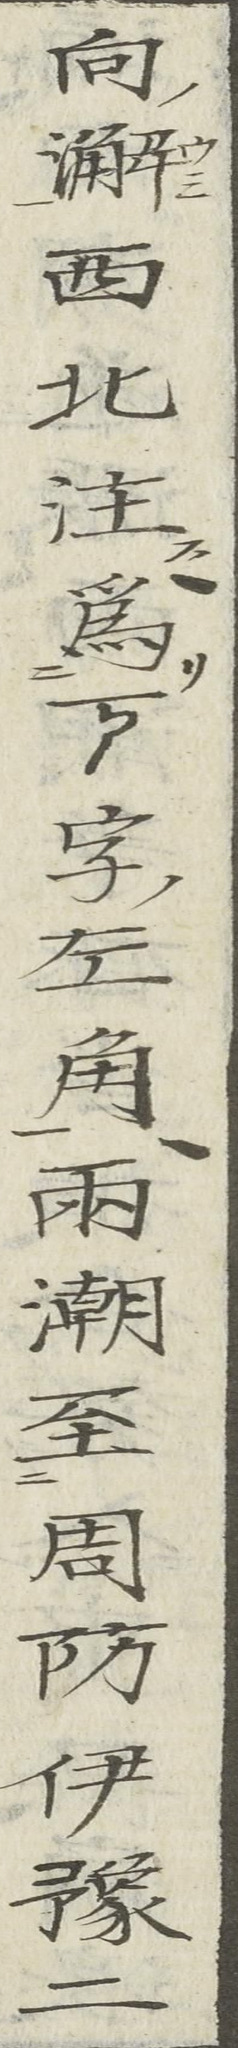向澥西北注、為丅字左角、兩潮至周防伊豫二
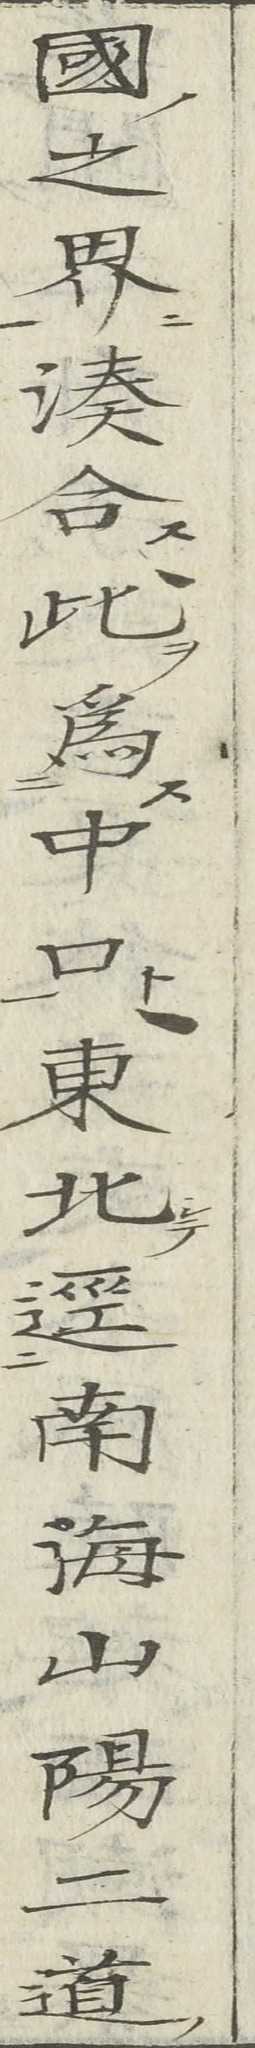国之界、湊合此為中口、東北逕南海山陽二道
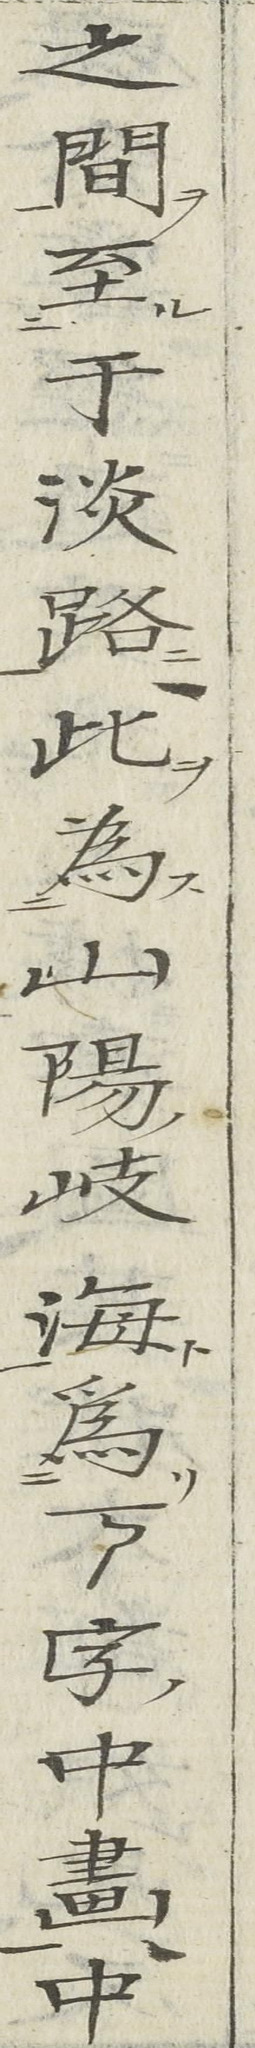之間至于淡路、此為山陽岐海為丅字中畫、中
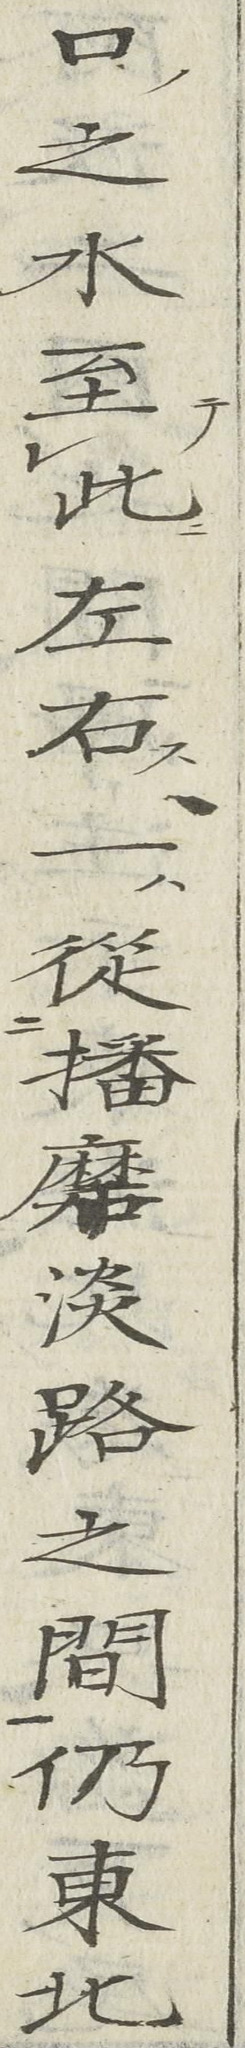口之水至此左右、一従播磨淡路之間仍東北
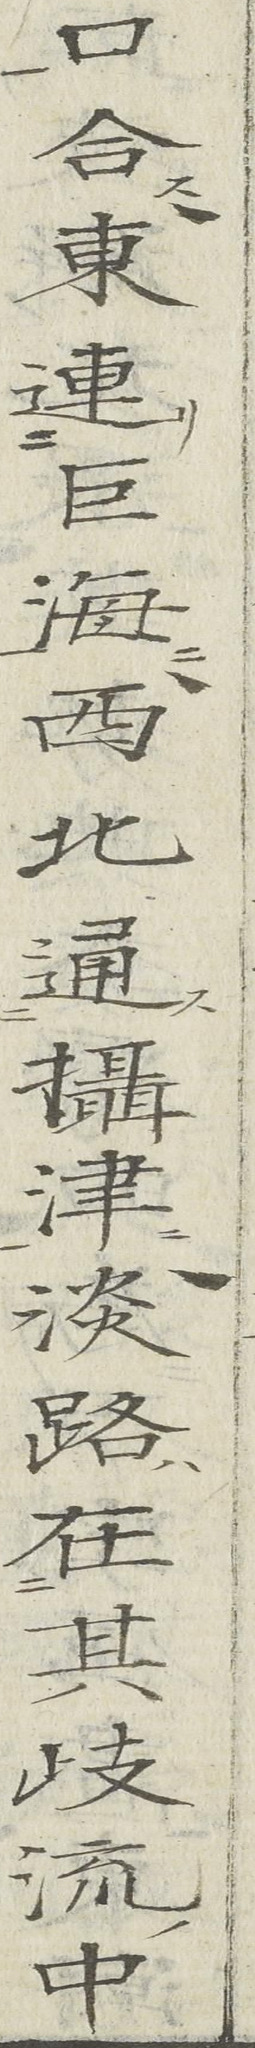口合、東連巨海、西北通摂津、淡路在其歧流中
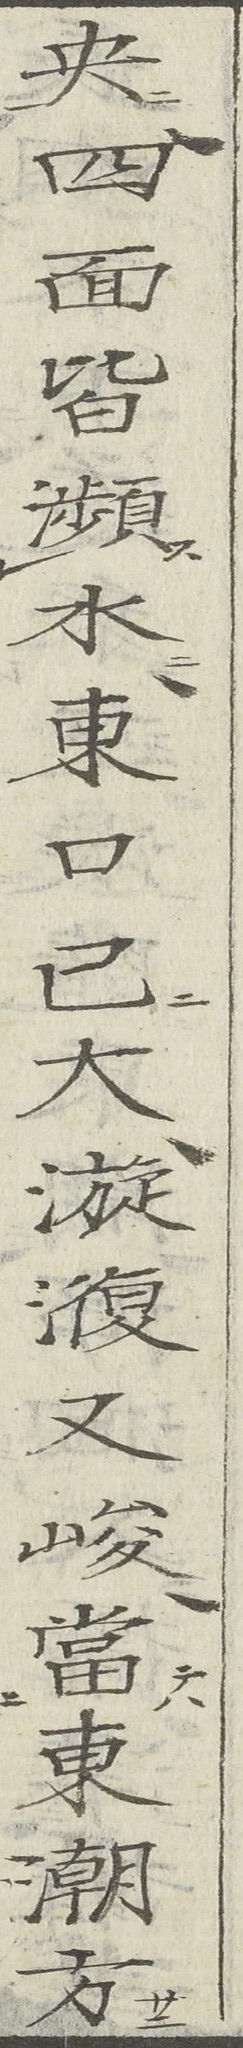夹、四面皆瀕水、東口已大、漩澓又峻、当東潮方

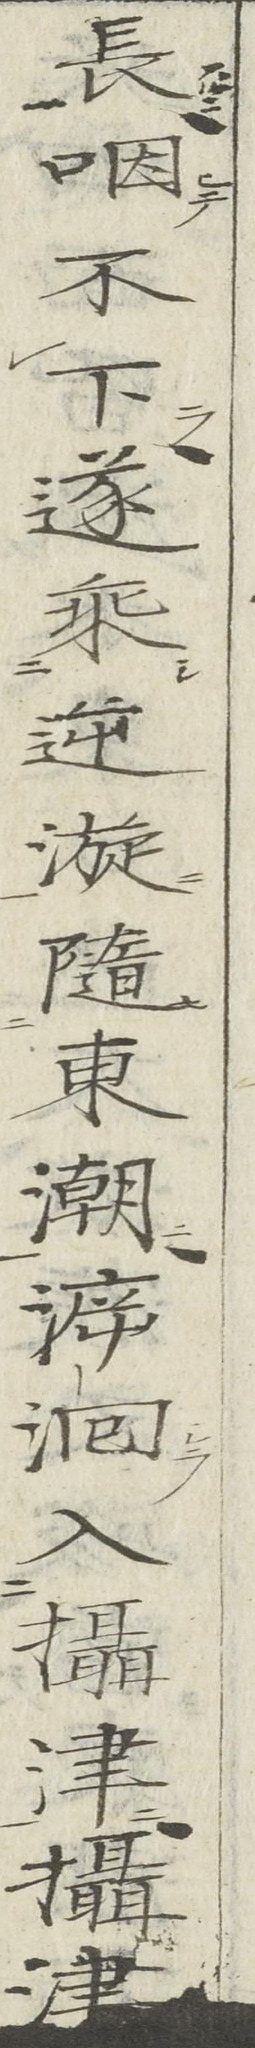長咽不下、遂乗逆漩随東潮、泝洄入摂津、摂津
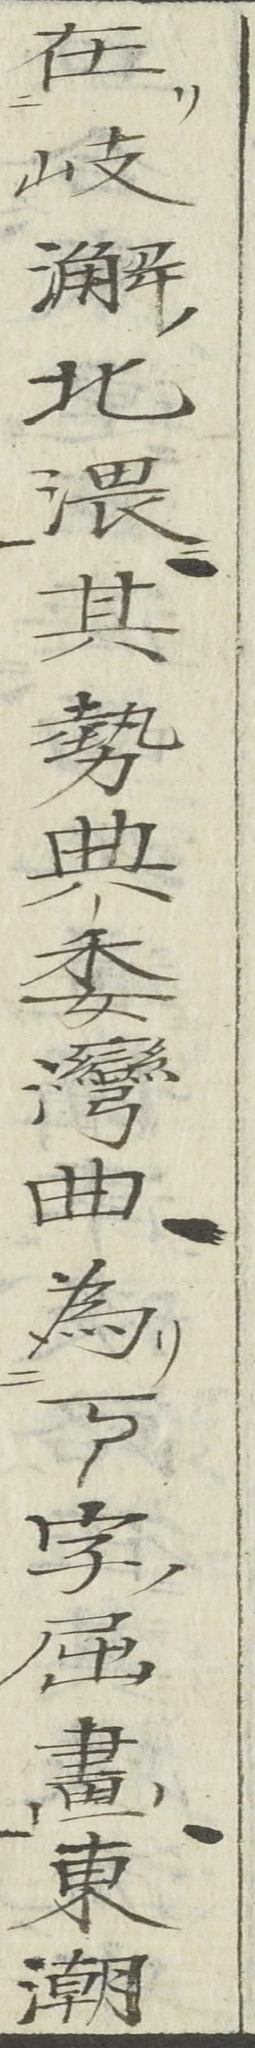在岐澥北渨、其勢典委湾曲、為丅字屈書、東潮
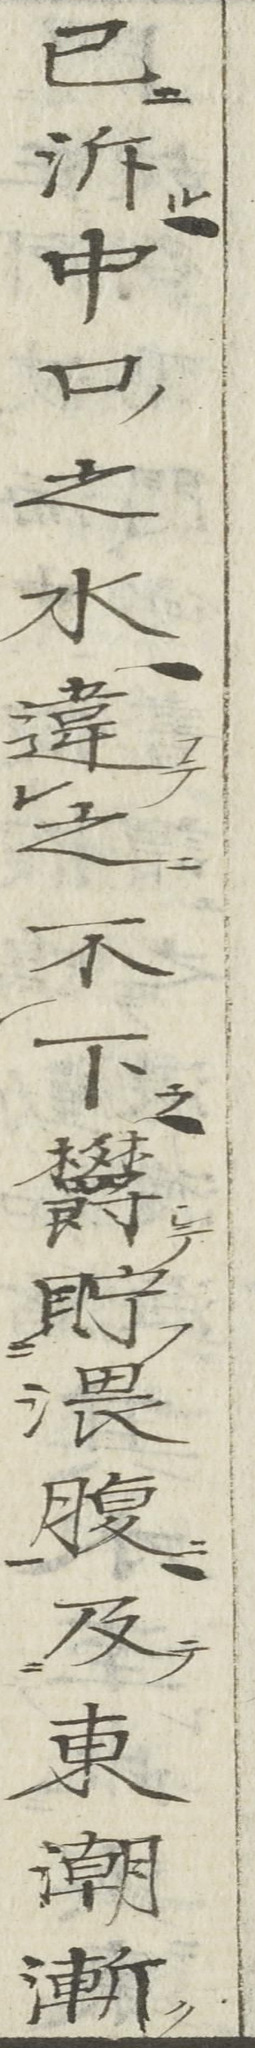已泝、中口之水、違之不下、欝貯渨腹、及東潮漸
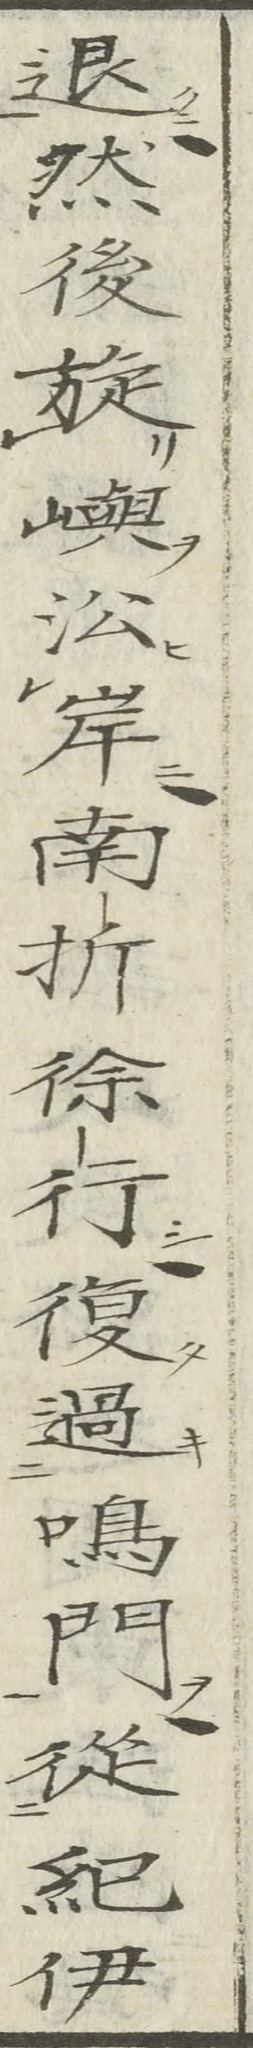退、然後旋嶼沿岸、南折徐行、復過鳴門、従紀伊
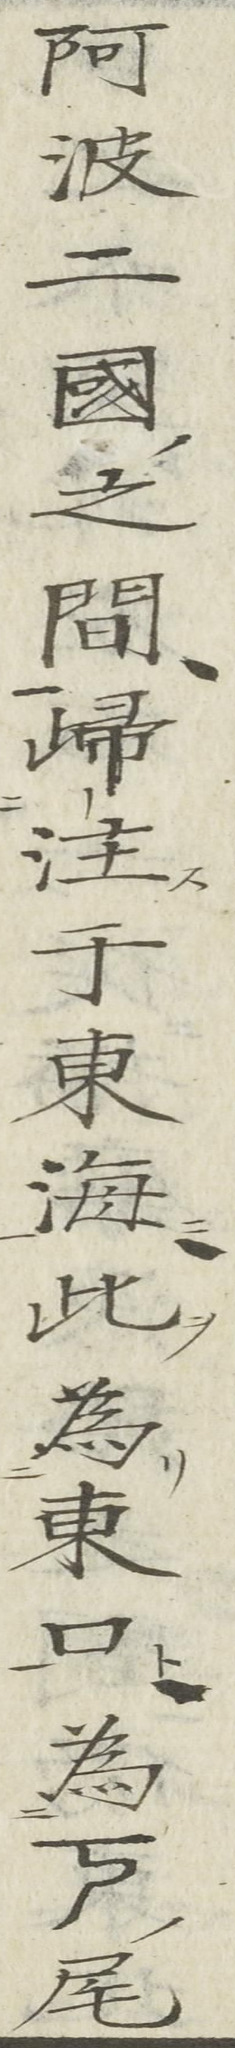阿波二国之間、㱕注于東海、此為東口、為丅尾
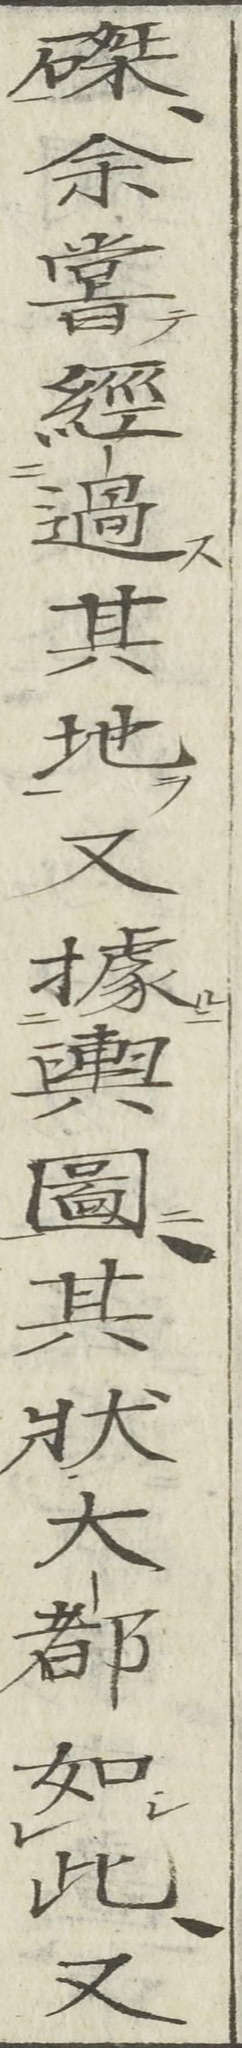磔、余嘗経過其地又據輿図、其状大都如此、又
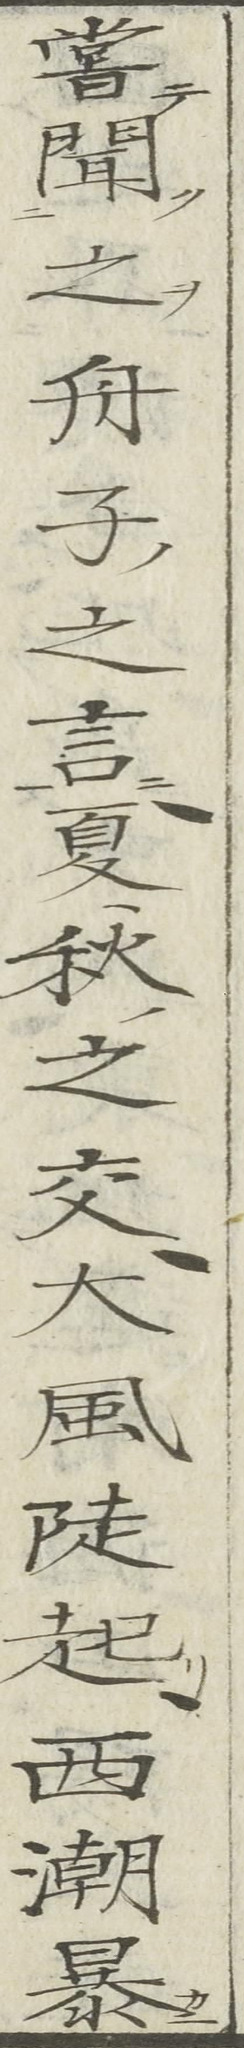嘗聞之舟子之言、夏秋之交、大風陡起、西潮暴
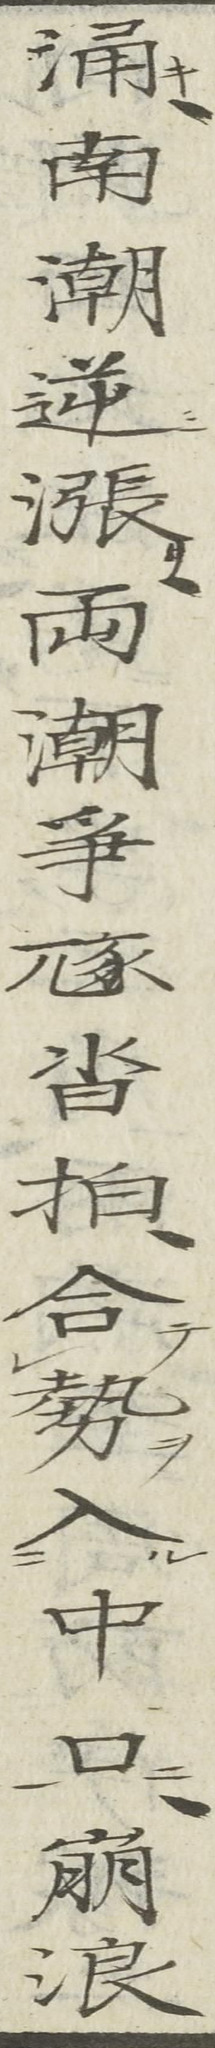涌、南潮逆漲、両潮争豗沓拍、合勢入中口、崩張
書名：海翻考　全
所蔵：東京大学地震研究所図書室 Earthquake Research Institute Library, The University of Tokyo, JAPAN
